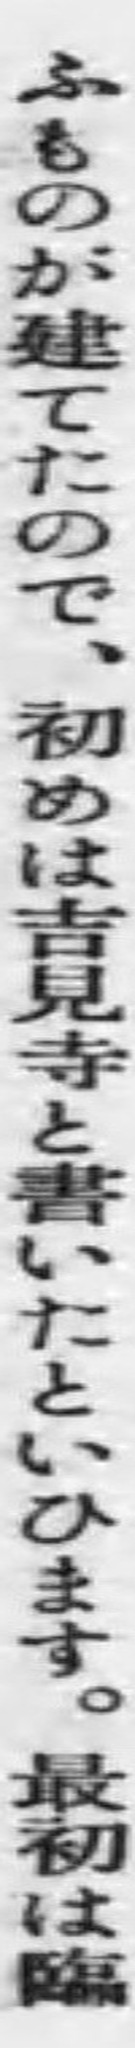ふものが建てたので、初めは吉見寺と書いたといひます。最初は臨
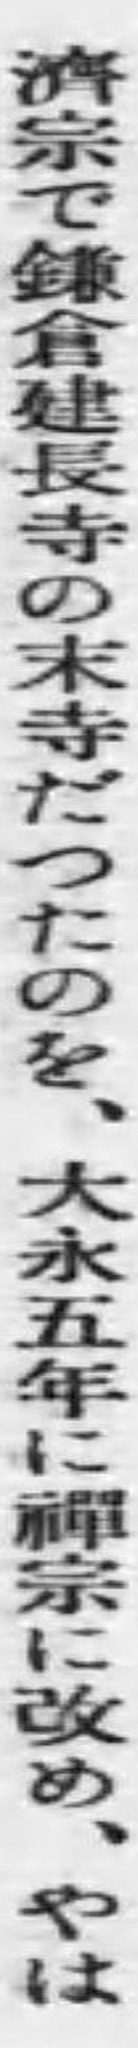済宗で鎌倉建長寺の末寺だつたのを、大永五年に禅宗に改め、やは
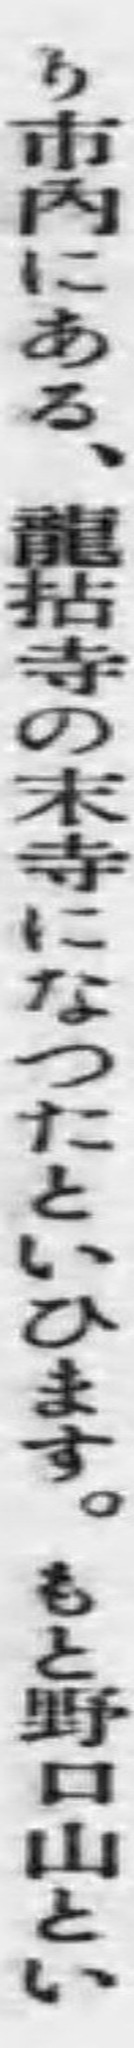り市内にある、龍拈寺の末寺になつたといひます。もと野口山とい
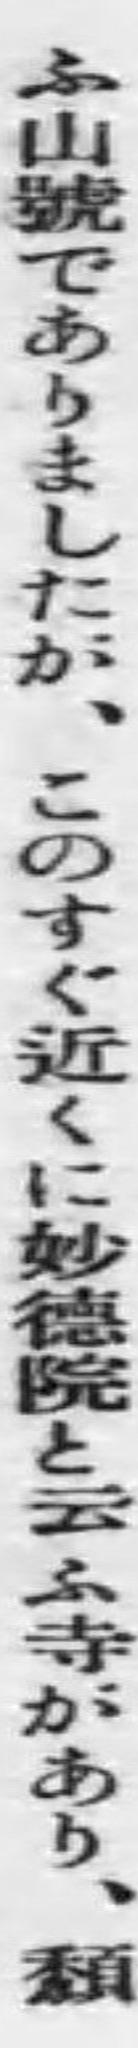ふ山号でありましたが、このすぐ近くに妙徳院と云ふ寺があり、頽
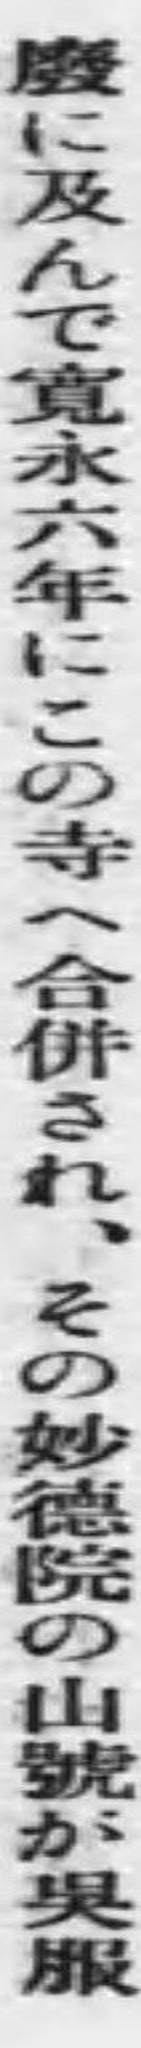廃に及んで寛永六年にこの寺へ合併され、その妙徳院の山号が呉服
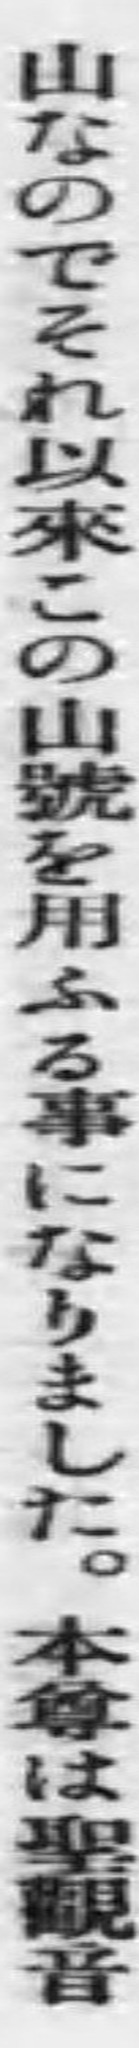山なのでそれ以来この山号を用ふる事になりました。本尊は聖観音
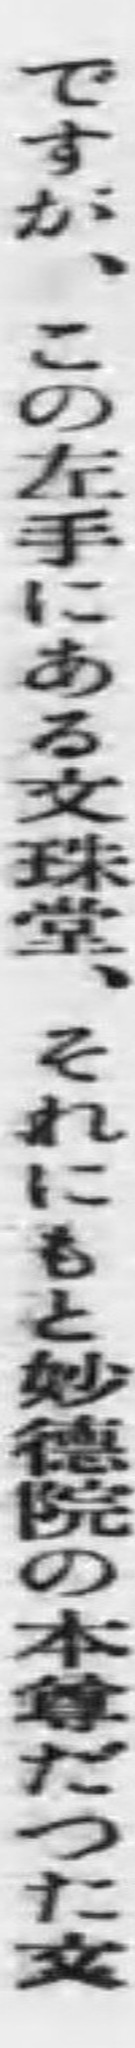ですが、この左手にある文珠堂、それにもと妙徳院の本尊だつた文
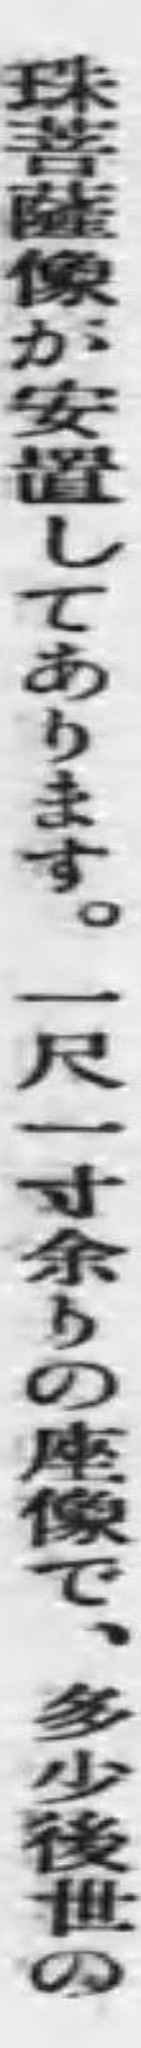珠菩薩像が安置してあります。一尺一寸余りの座像で、多少後世の
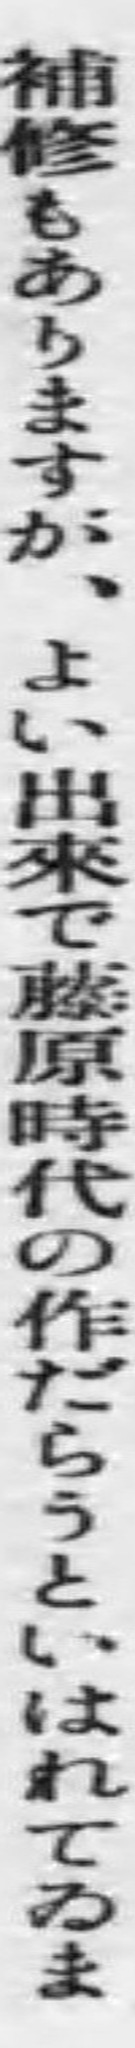補修もありますが、よい出来で藤原時代の作だらうといはれてゐま
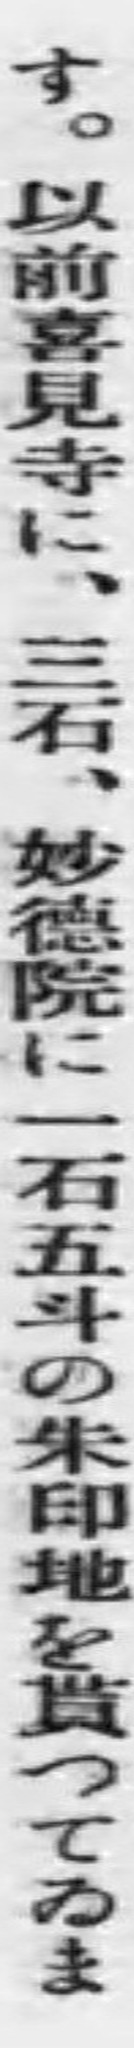す。以前喜見寺に、三石、妙徳院に一石五斗の朱印地を貰つてゐま
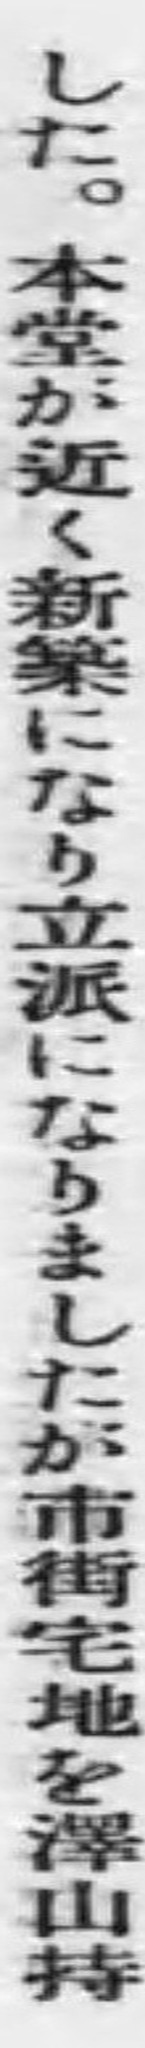した。本堂が近く新築になり立派になりましたが市街宅地を沢山持
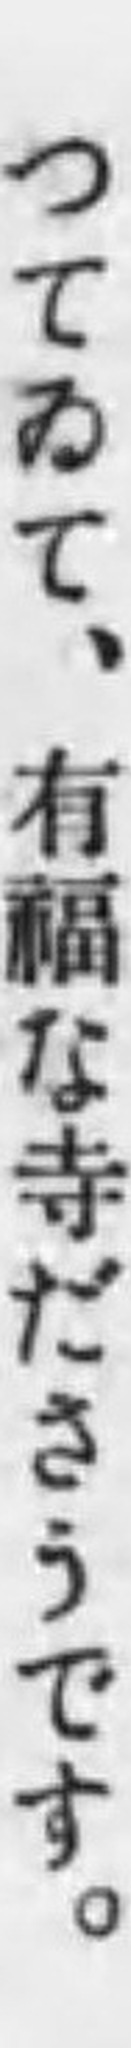つてゐて、有福な寺ださうです。
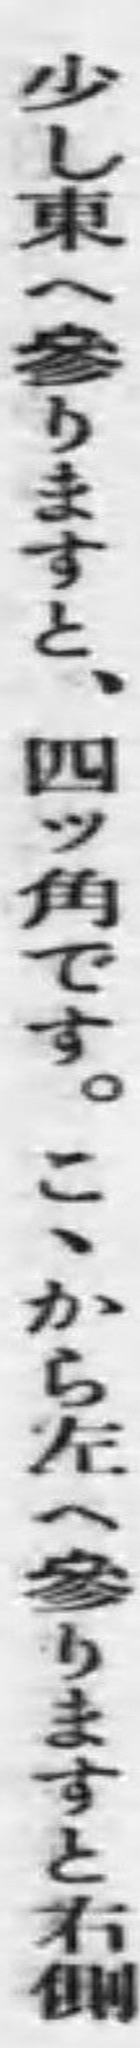少し東へ参りますと、四ツ角です。こゝから左へ参りますと右側
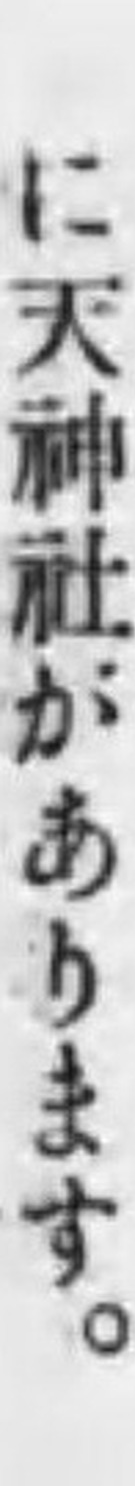に天神社があります。
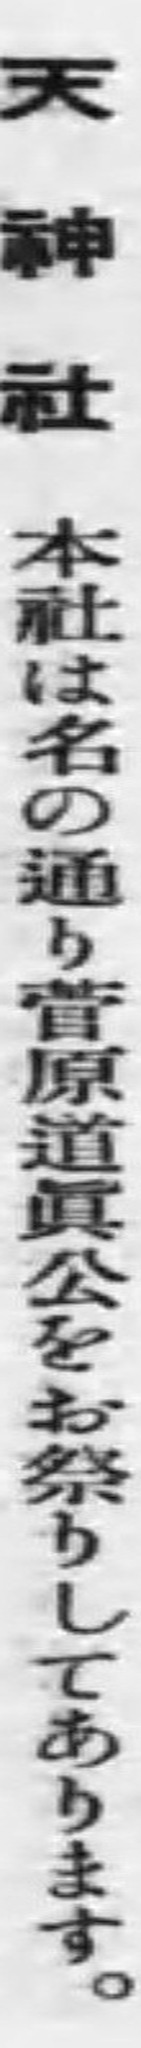天神社本社は名の通り菅原道真公をお祭りしてあります。
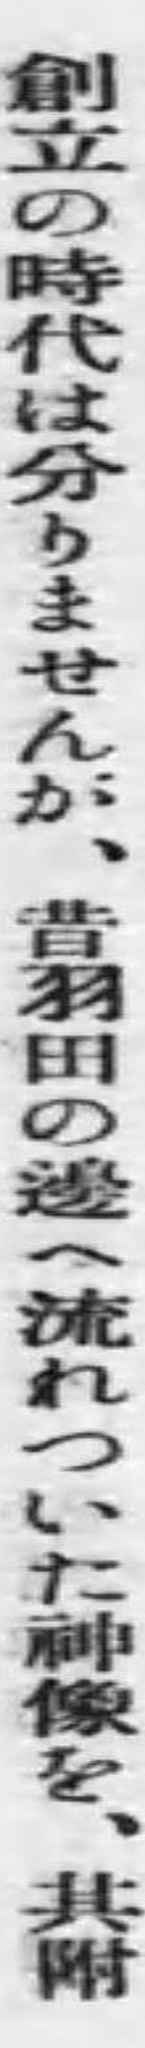創立の時代は分りませんが、昔羽田の辺へ流れついた神像を、其附
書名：東三河道中記 : 豊橋市及其附近案内
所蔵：国立国会図書館 National Diet Library, JAPAN
